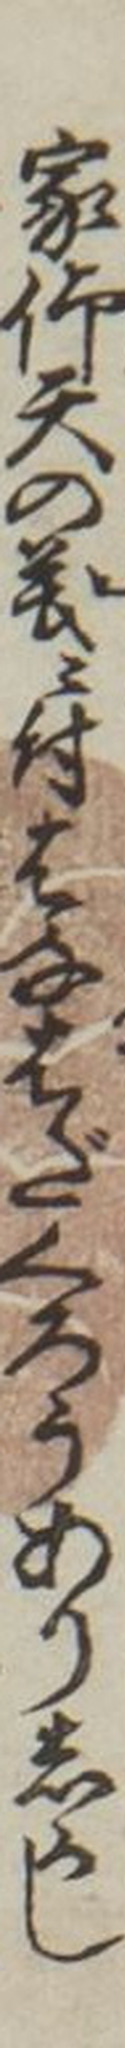家仰天の義に付はなはだくろうありしかし
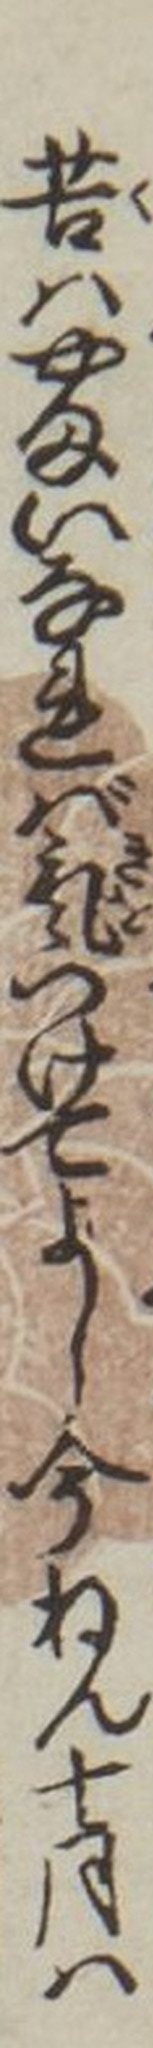苦はやまいなれば気つけてよし今ねん十月は
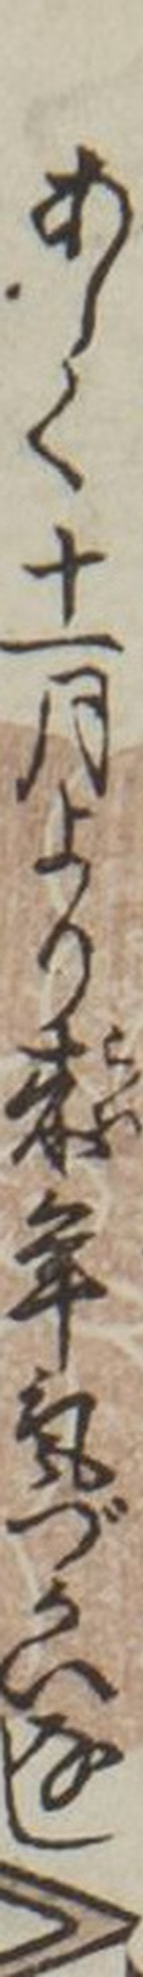あしく十一月より来年気づかいなし
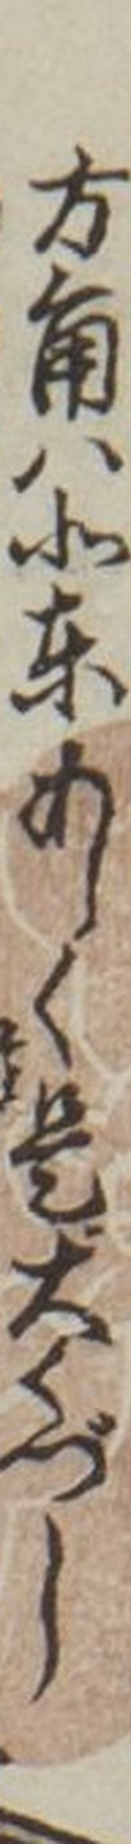方角は北東あしく是大くづし
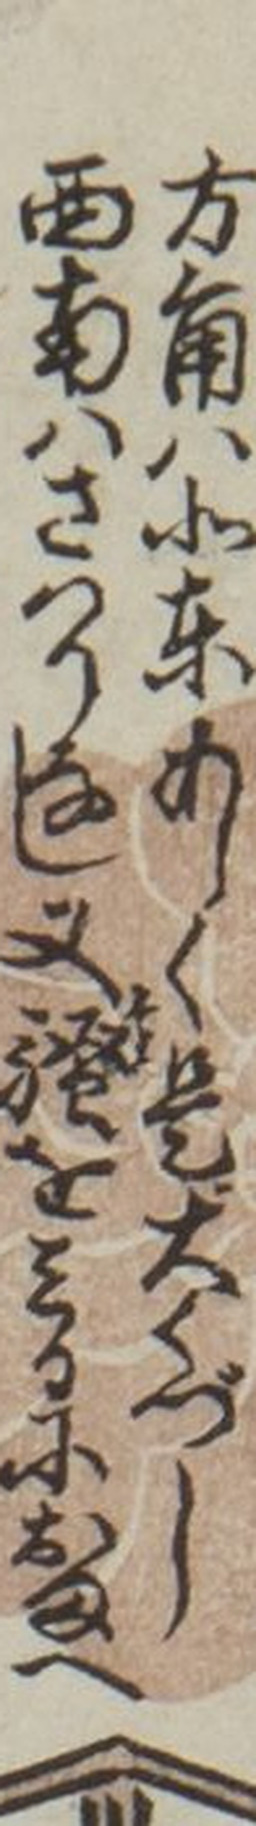西南はさはりなし又騒をみるにおまへ
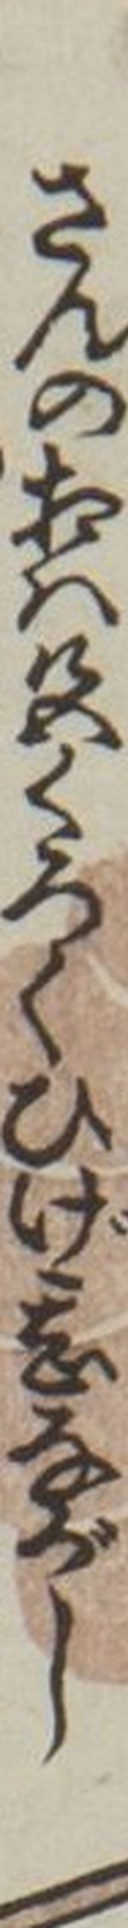さんの相は色くろくひげ甚ながし
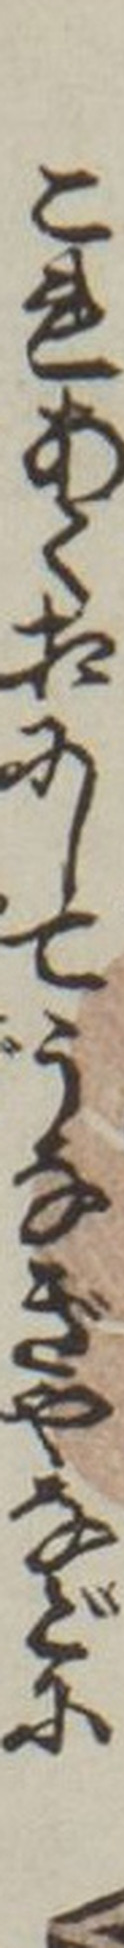これあく相にしてうなぎやなどに
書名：浮世辻うらなひ
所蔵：あいおいニッセイ同和損保株式会社
